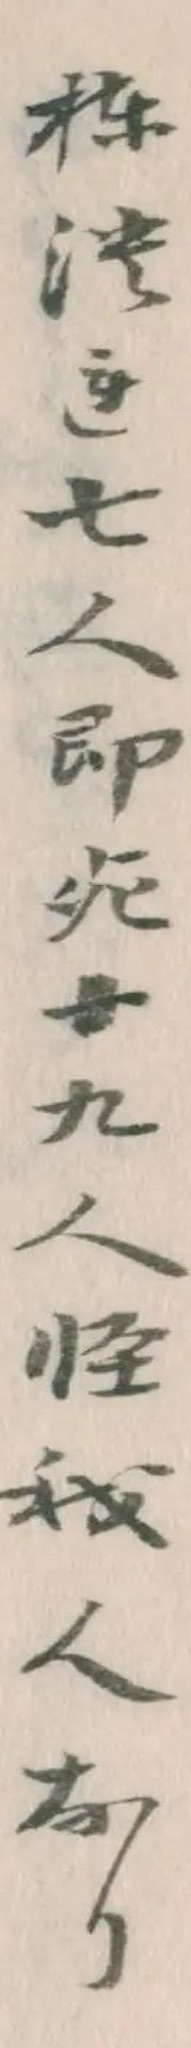棟潰れ七人即死十九人怪我人なり
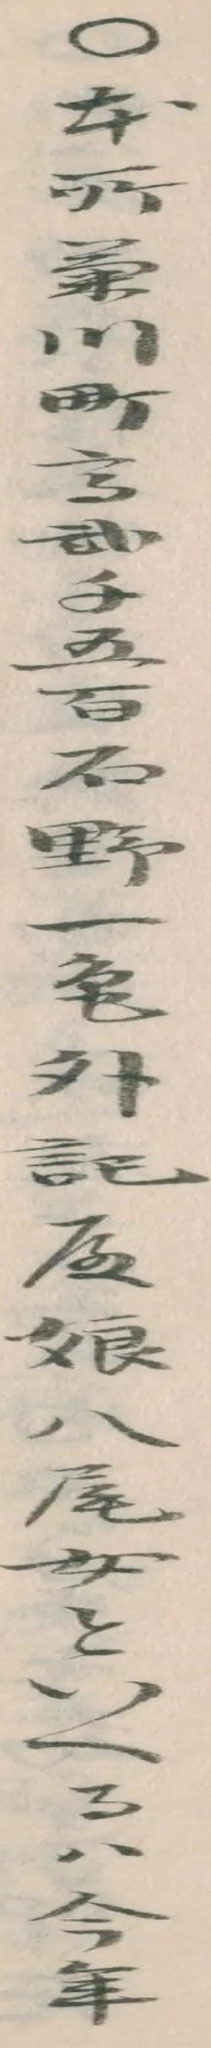〇本所菊川町高弐千五百石野一色外記殿娘八尾女といへるは今年

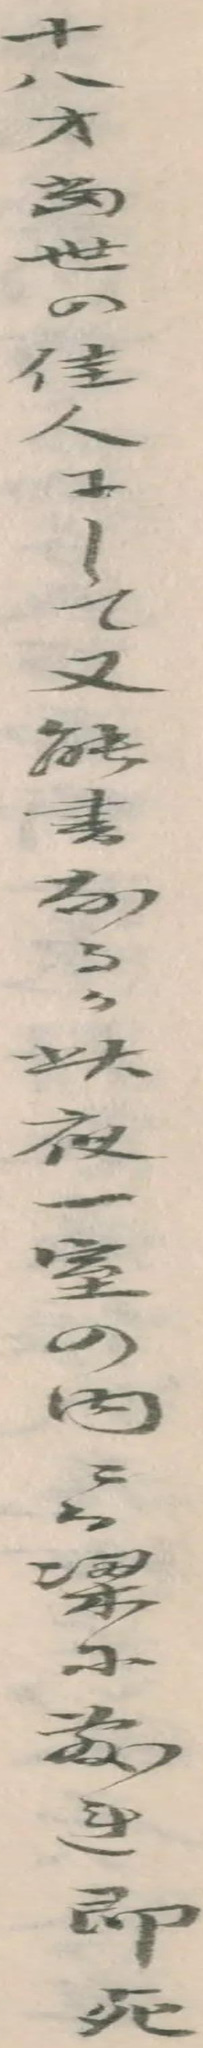十八才当世の佳人にして又能書なるか此夜一室の内にて梁に敷れ即死
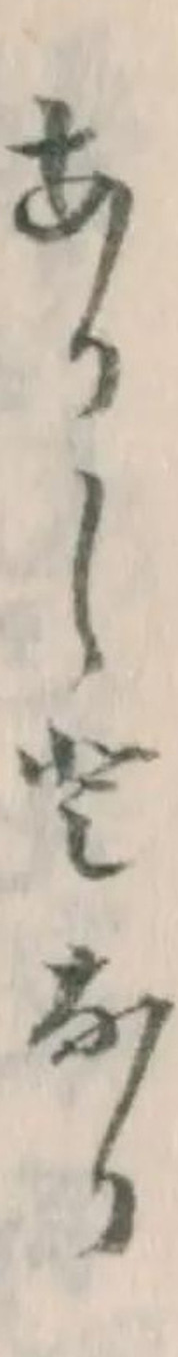ありしとなり
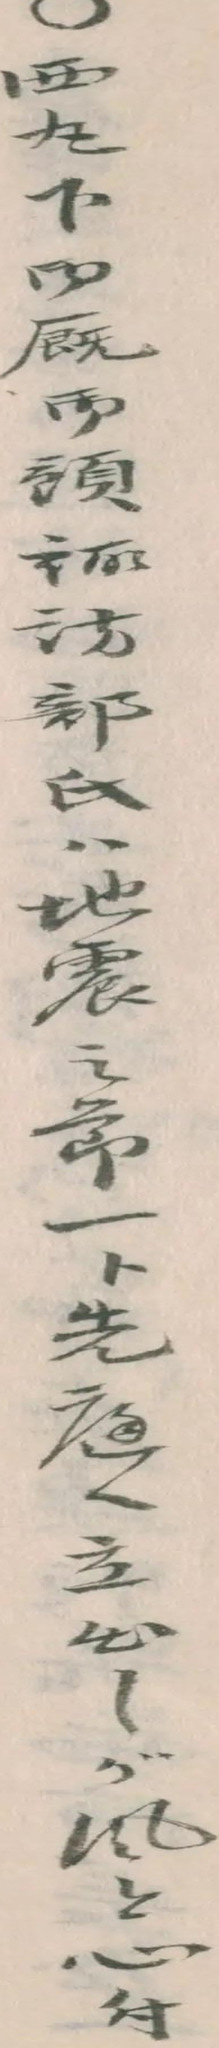〇西丸下御厩御頭諏訪部氏は地震之節一ト先庭へ立出しが風と心付
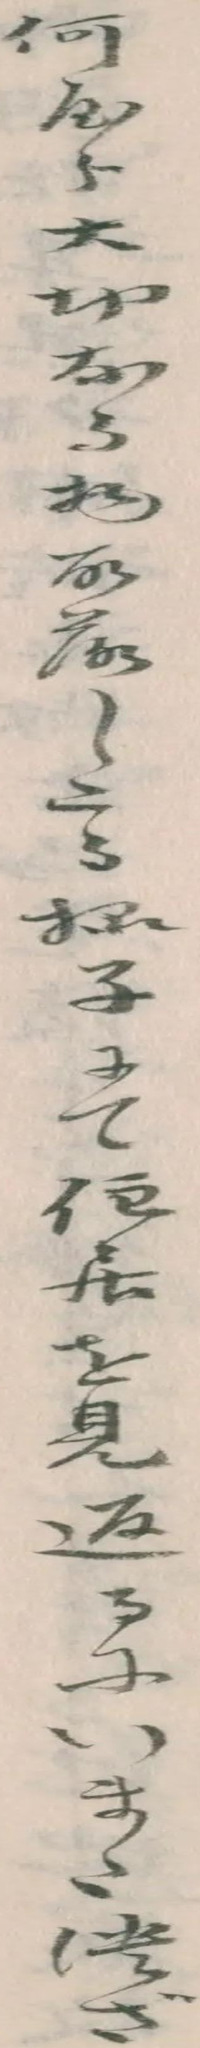何やら大切なる物取落したる様子にて住居を見返るにいまた潰ざ
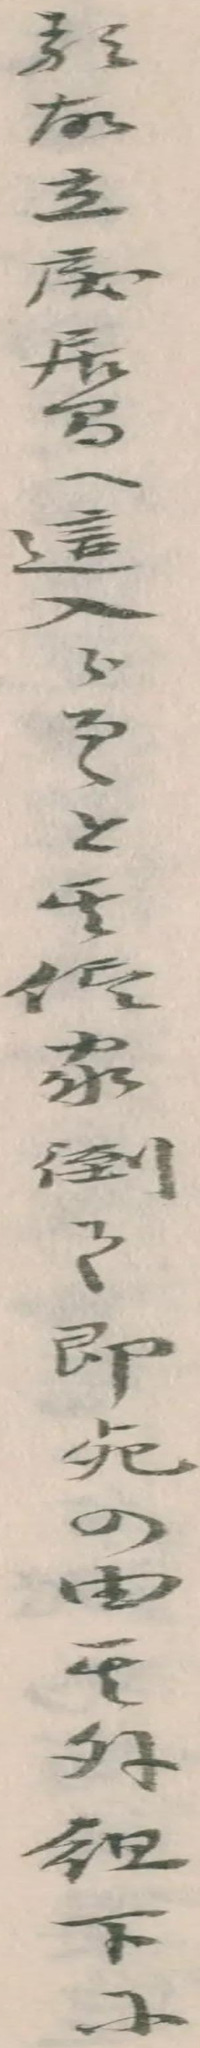る故立戻居間へ這入らるゝと其侭家倒て即死の由其外組下に
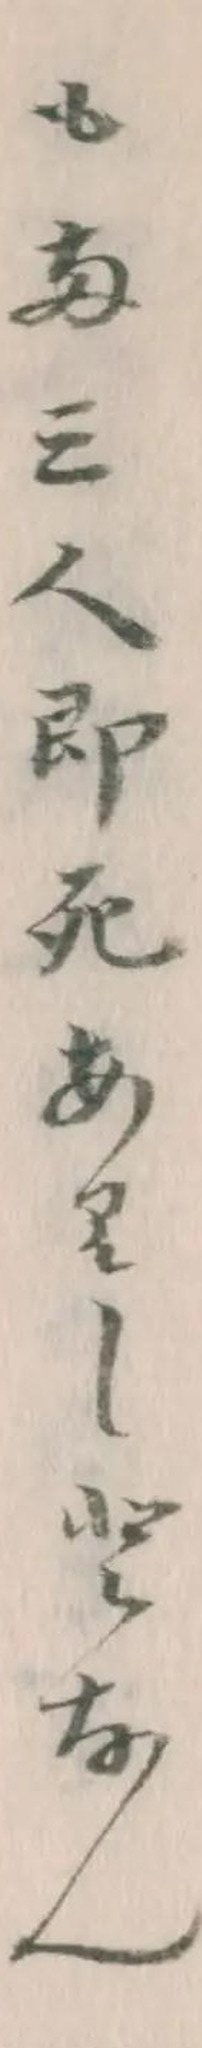も両三人即死ありしとなん
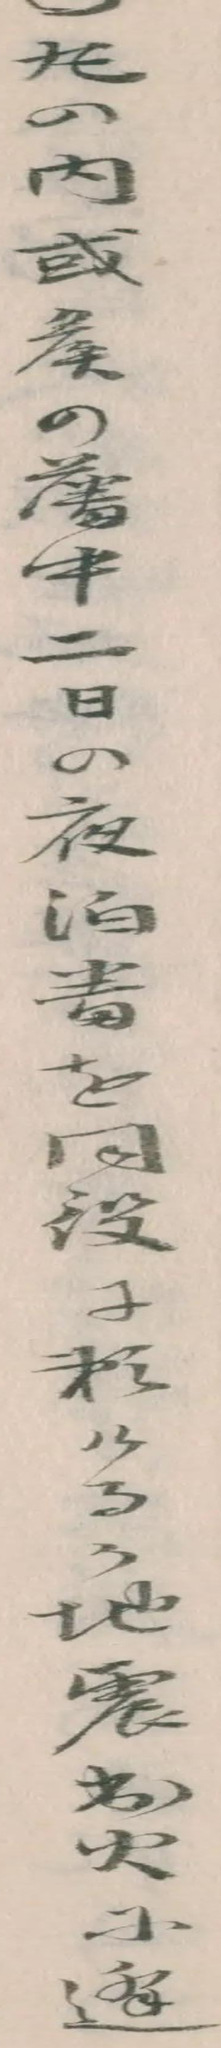〇丸の内或侯の藩中二日の夜泊番を同役に頼けるか地震出火に逢
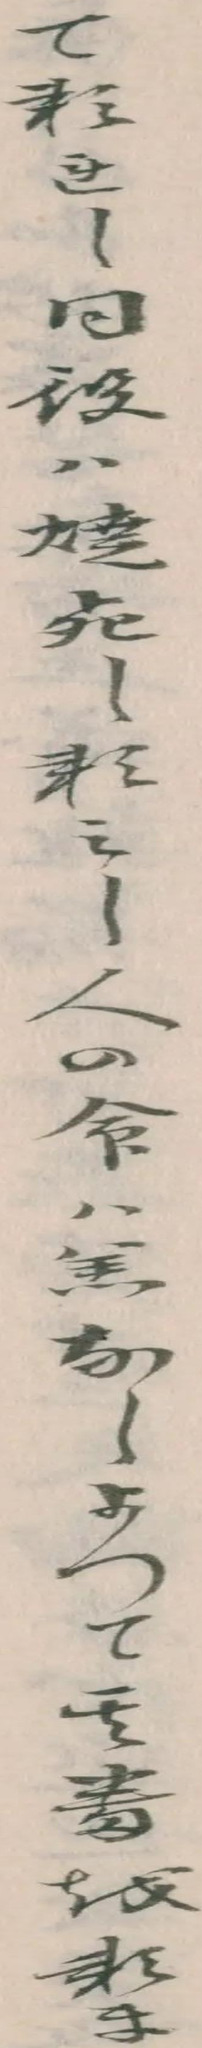て頼れし同役は焼死し頼みし人の命は恙なしよつて其番を頼ま
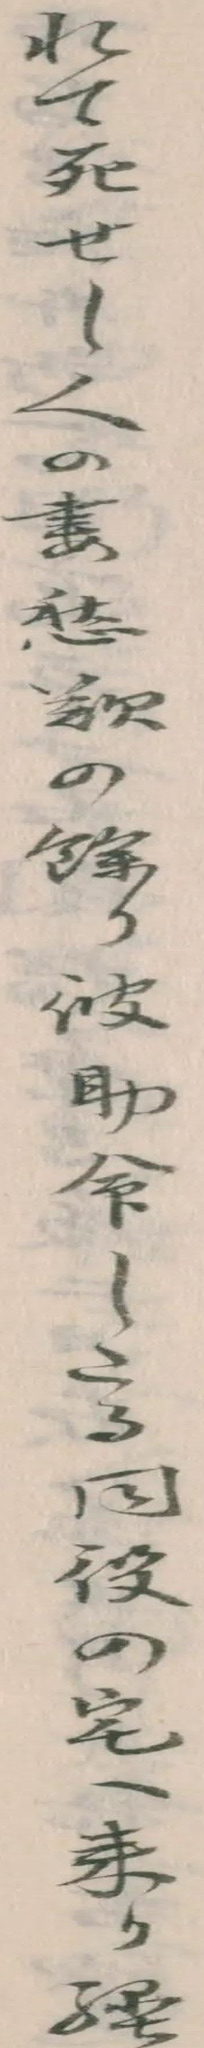れて死せし人の妻愁歎の余彼助命したる同役の宅へ来り繰
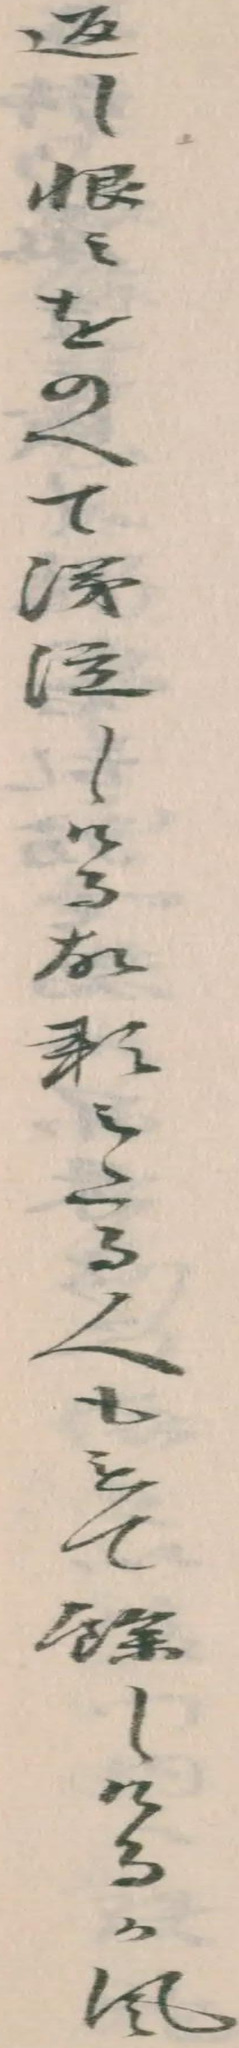返し恨みをのへて涕泣しける故頼みたる人ももて余しけるか風
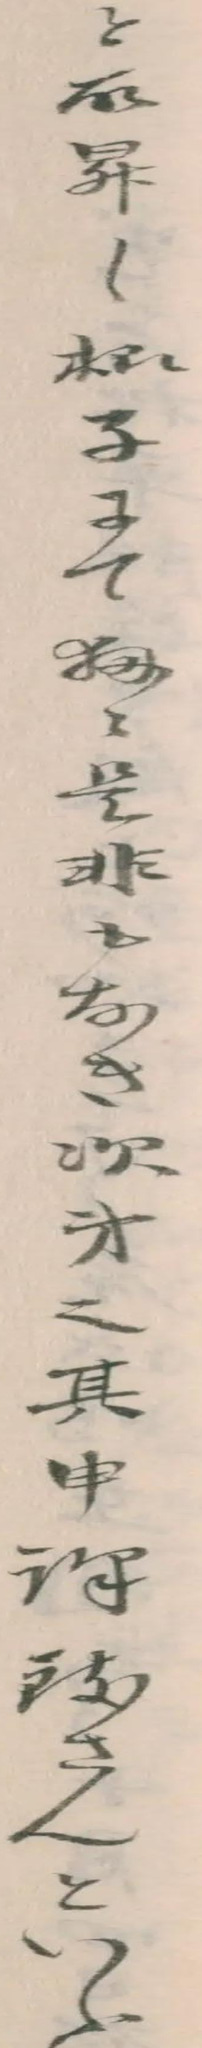と取昇し様子にて扨々是非もなき次第也其申訳致さんといふ
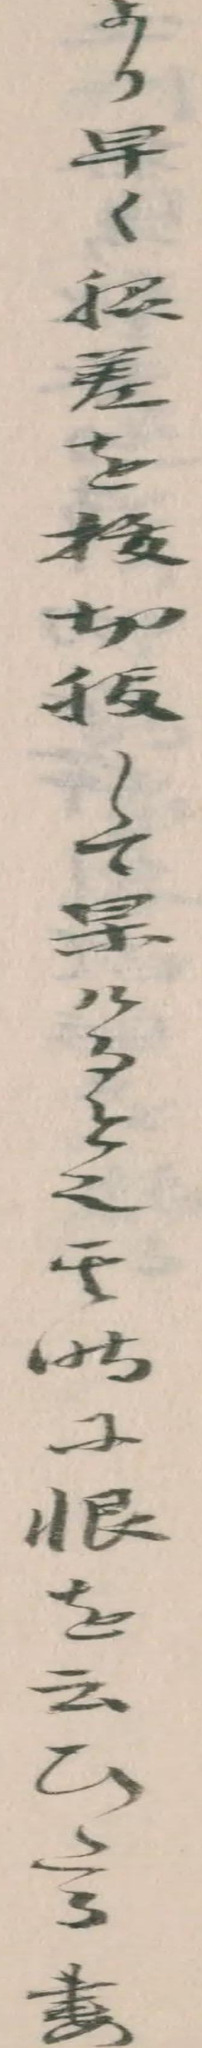より早く脇差を抜切腹して果けると也其時に恨を云ひたる妻
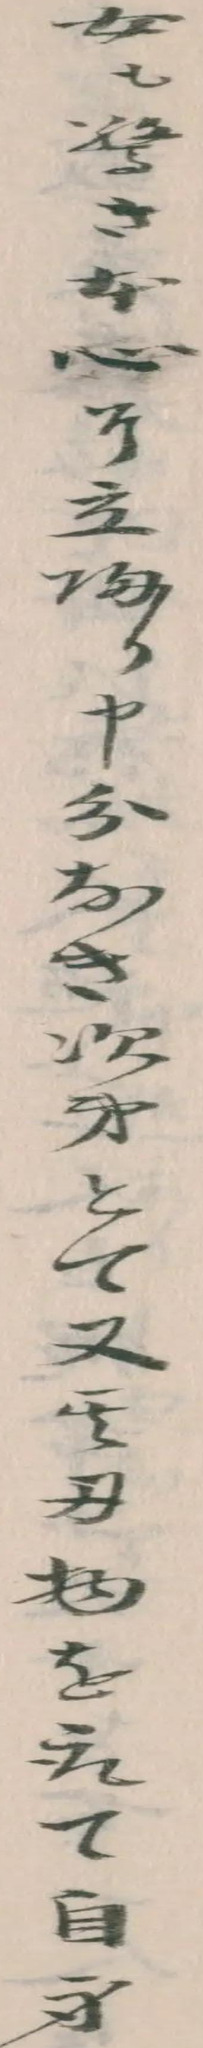女も驚き本心に立帰り申分なき次第とて又其刃物を取て自身
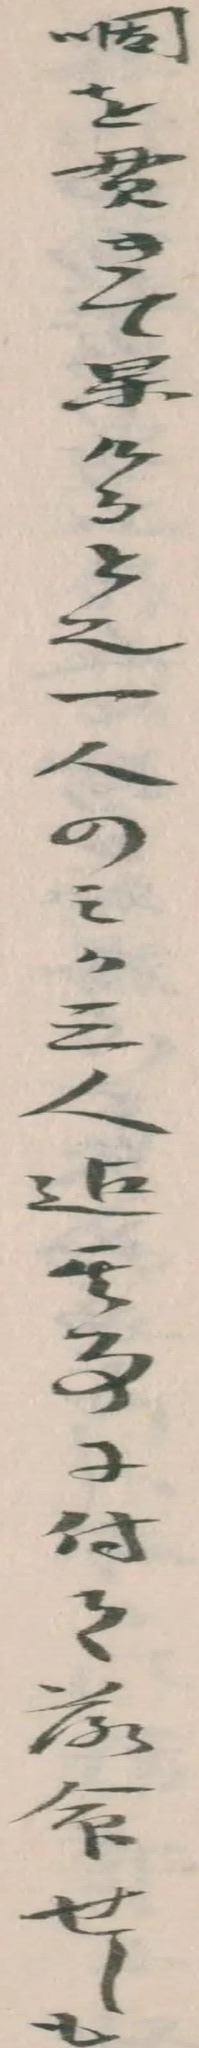咽を貫きて果けると也一人のみか三人迄其事に付て落命せしも
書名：地災撮要. 巻10(地震之部) 上,下
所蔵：国立国会図書館 National Diet Library, JAPAN
